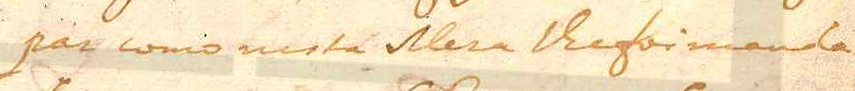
pas como nesta Meza lhe foi manda
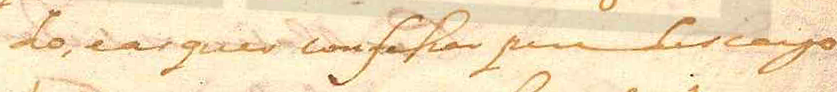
do, e as quer confessar pera descargo
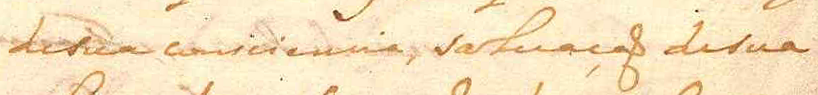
de sua consciencia, saluaçaõ de sua
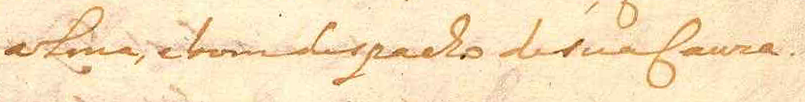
alma, e bom despacho de sua Cauza.
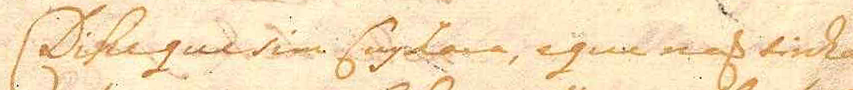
Disse que sim Cuydara, e que naõ tinha
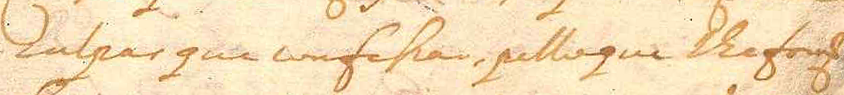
culpas que confessar, pello que lhe foraõ
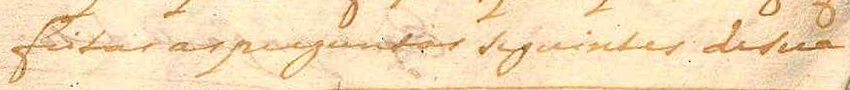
feitas as perguntas seguintes de sua
